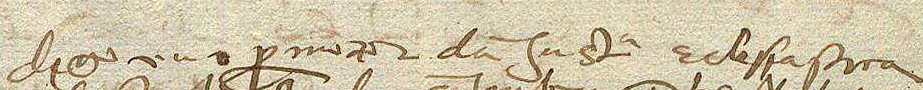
djgo eu o ꝓmotor da Justa Eclesjastica
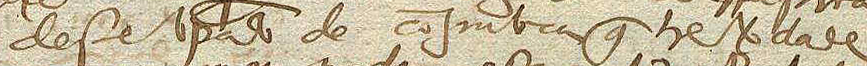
deste bpādo de coJmbra q̄ he ꝟdade
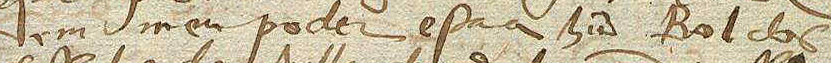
em meu poder estaa hū Rol dos
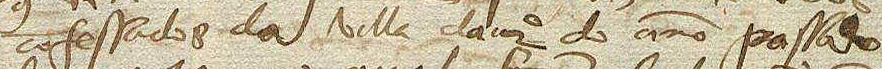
cōfessados da villa dauro do an̄o passado
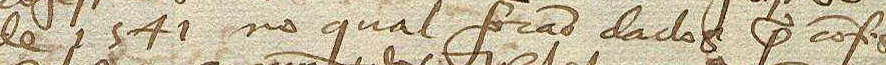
de 1541 no qual forão dados p̄o c̄ofes
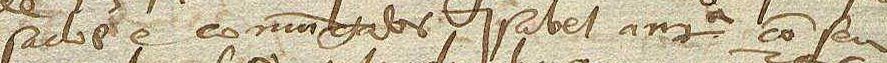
sados e comūgados Jsabel anta c̄o seu
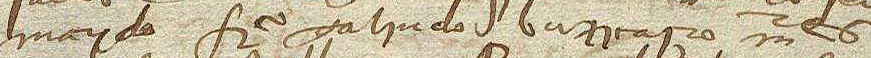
marjdo frco galjndo buticajro mres
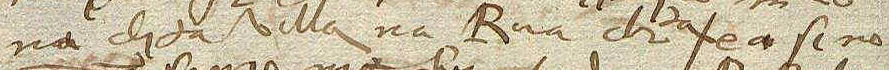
na djta villa na Rua drta / e asi no
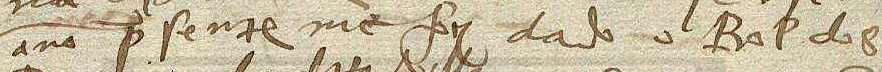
an̄o p̄sente me foy dado o Rol dos
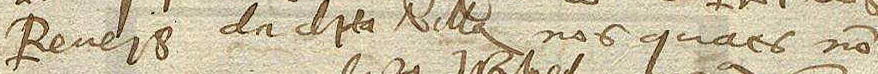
Reuejs da djta villa nos quaes nō
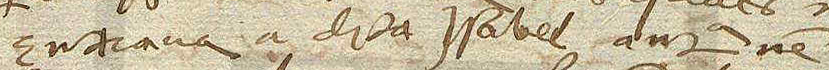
Entraua a djta Jsabel anta nē
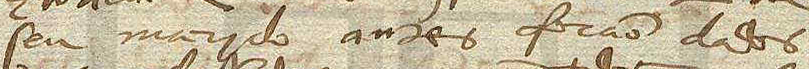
seu marjdo antes foraõ dados
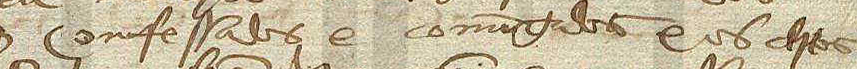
p̄o comfessados e comūgados e os djtos
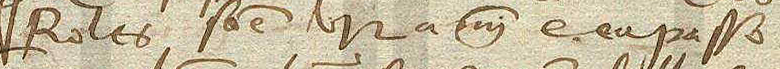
Roles soē vjr a m̄j e eu passo
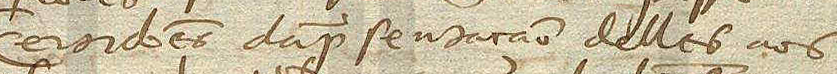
Certidoẽs dap̄sentaçaõ delles aos
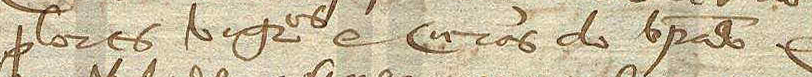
plores vigros e curas do bp̄ado e
